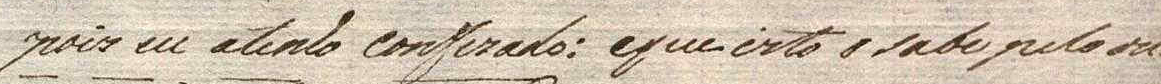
pois eu a tenho confesado: e que isto o sabe pelo ou
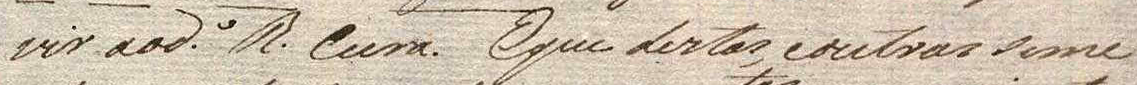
vir ao d.o R. Cura. E que destas, e outras seme
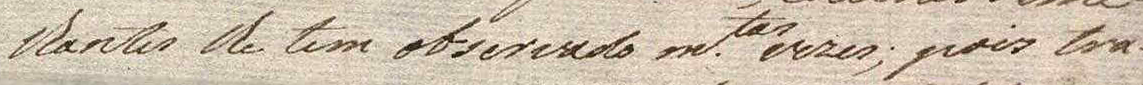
lhantes lhe tem observado m.tas vezes; pois tra
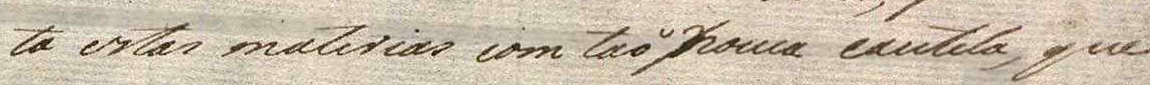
ta estas materias com taõ pouca cautela, que
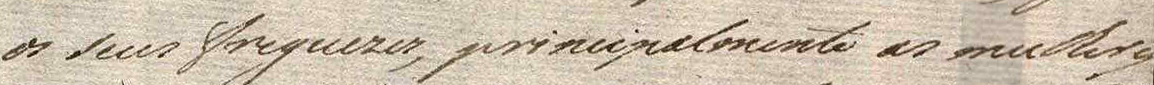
os seus freguezes, principalmente as mulheres
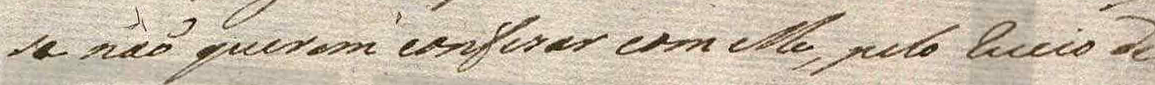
se naõ querem confesar com elle, pelo Receio de
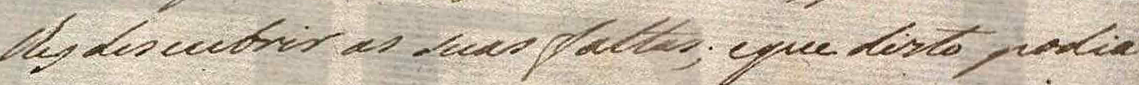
lhes descubrir as suas faltas, e que disto podia
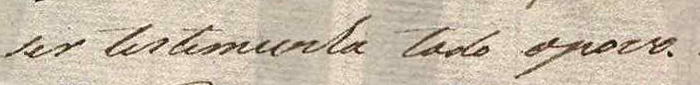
ser testemunha todo o povo.
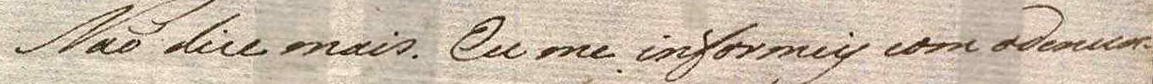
Naõ dice mais. Eu me informey com o denun
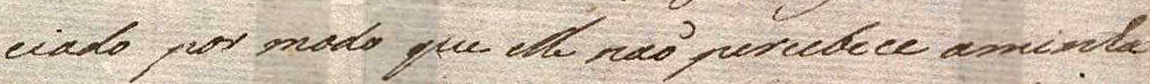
ciado por modo que elle naõ percebece a minha
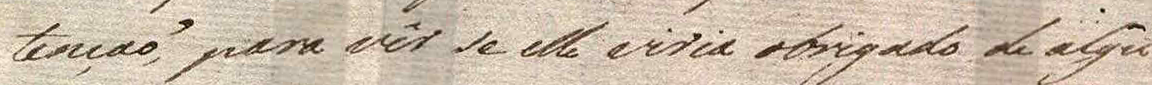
tençaõ, para vêr se elle viria obrigado de algū
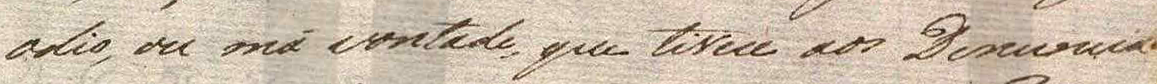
odio, ou má vontade, que tivece aos Denuncia
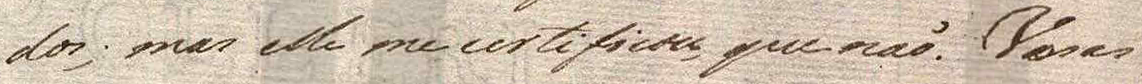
dos; mas elle me certificou, que naõ. Vosas
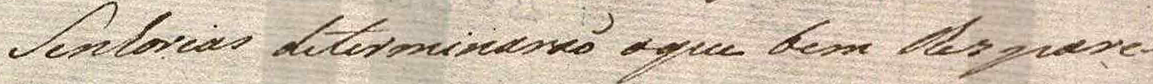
Senhorias determinaraõ o que bem lhes pare
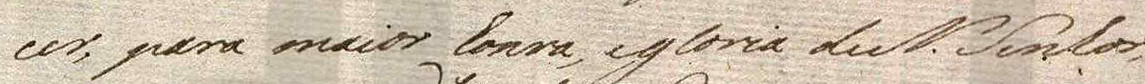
cer, para maior honra, e gloria de N. Senhor,
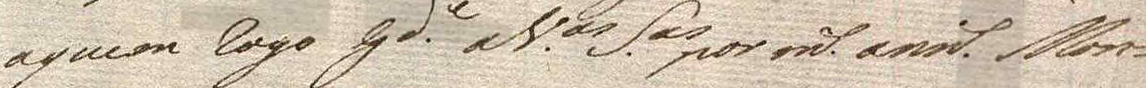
a quem Rogo Gd.e a V.as S.as por m.s ann.s Mon
